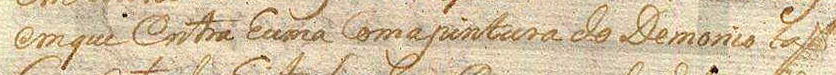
em que Entra huma Com a pintura do Demonio taõ
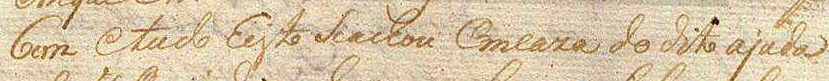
bem e tudo histo se achou Em caza do dito ajuda
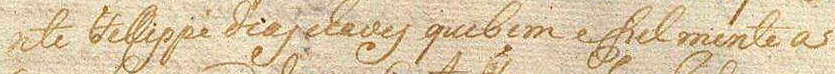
nte Fellippe dias chaves que bem e fielmente a
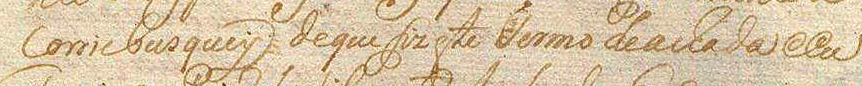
Corri busquey de que fiz este Termo de achada e eu
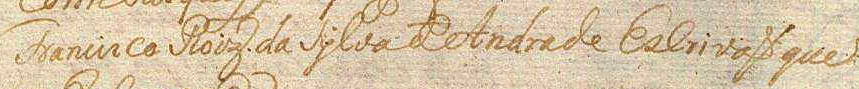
Francisco Roiz̄ da Sylva d̄ Andrade EsCrivaõ que
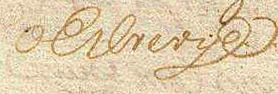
o EsCrevy
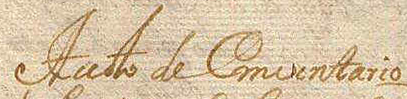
Autto de Emventario
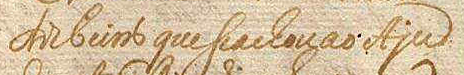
dos beins que se achou ao Aju
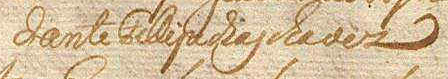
dante Fellipe dias chavez
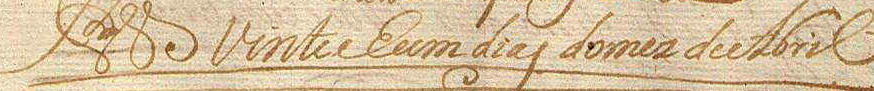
AOS vinte e hum dias do mez de Abril
